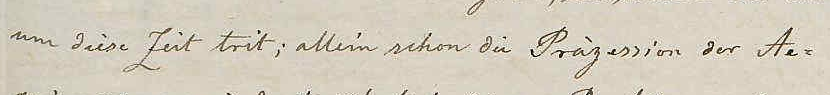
um diese Zeit trit; allein schon die Präzession der Ae-
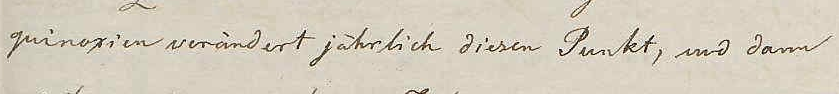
quinoxien verändert jährlich diesen Punkt, und dann
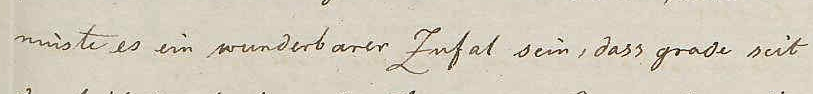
müste es ein wunderbarer Zufal sein, dass grade seit
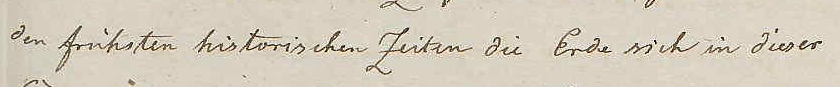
den frühsten historischen Zeiten die Erde sich in dieser
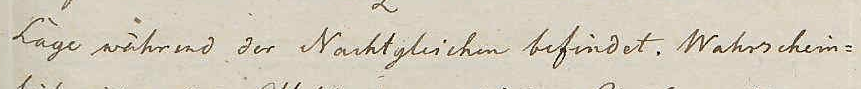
Läge während der Nachtgleichen befindet. Wahrschein-
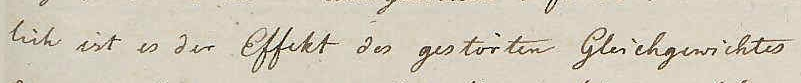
lich ist es der Effekt des gestörten Gleichgewichtes
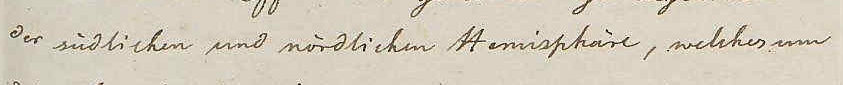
der südlichen und nördlichen Hemisphäre, welches um
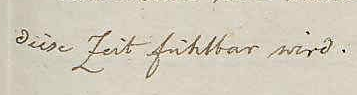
diese Zeit fühlbar wird.
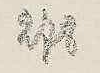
Reisen:
